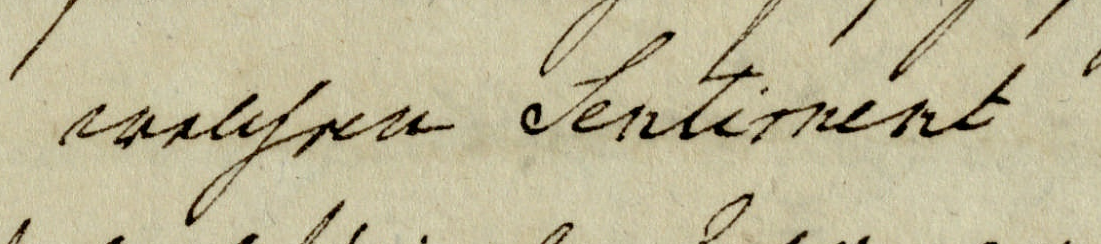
welchem Sentiment
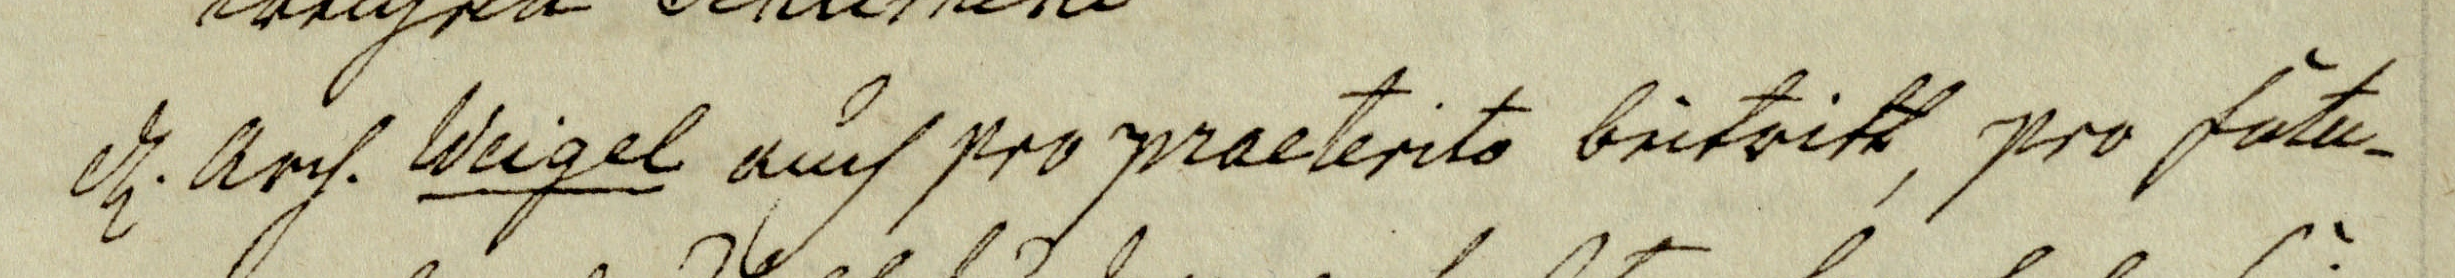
dh. Arch. Weigel auch pro praeterito beitritt, pro futu¬
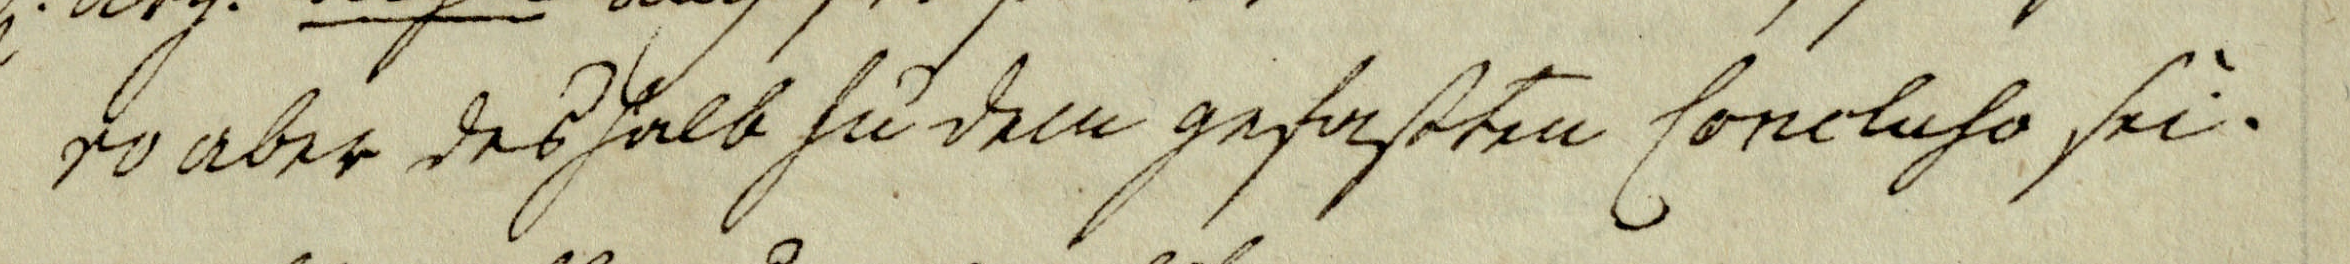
ro aber deshalb zu dem gefaßten Concluso sei¬
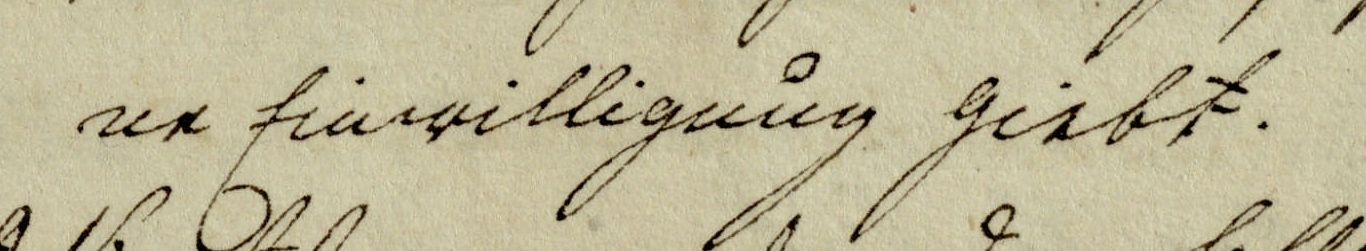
ne Einwilligung giebt.
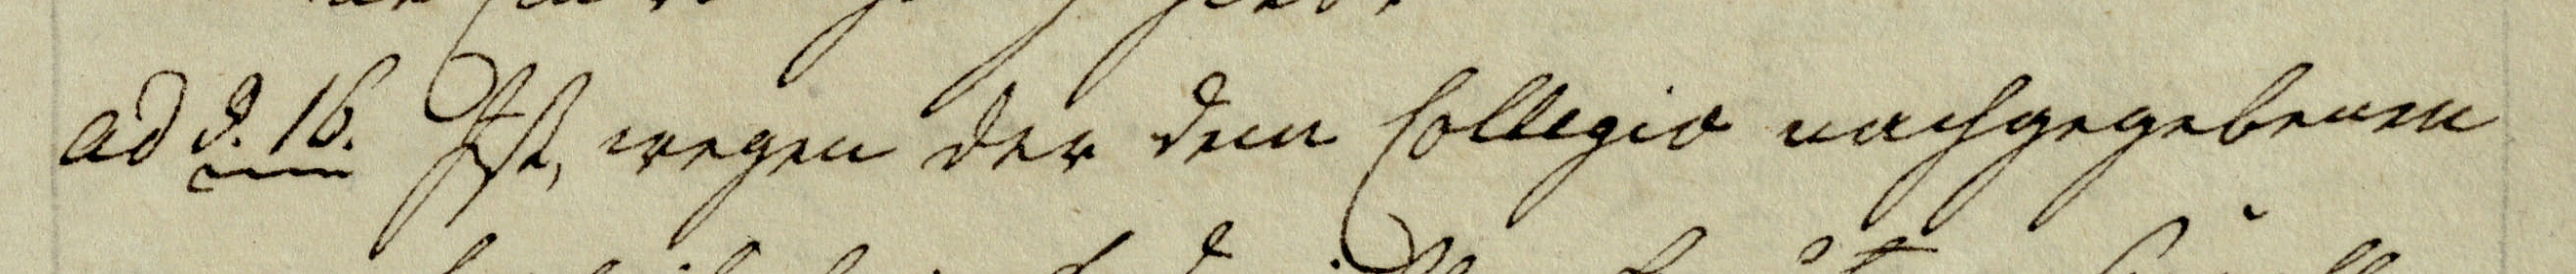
ad §. 16. Ist, wegen der dem Collegio nachgegebenen
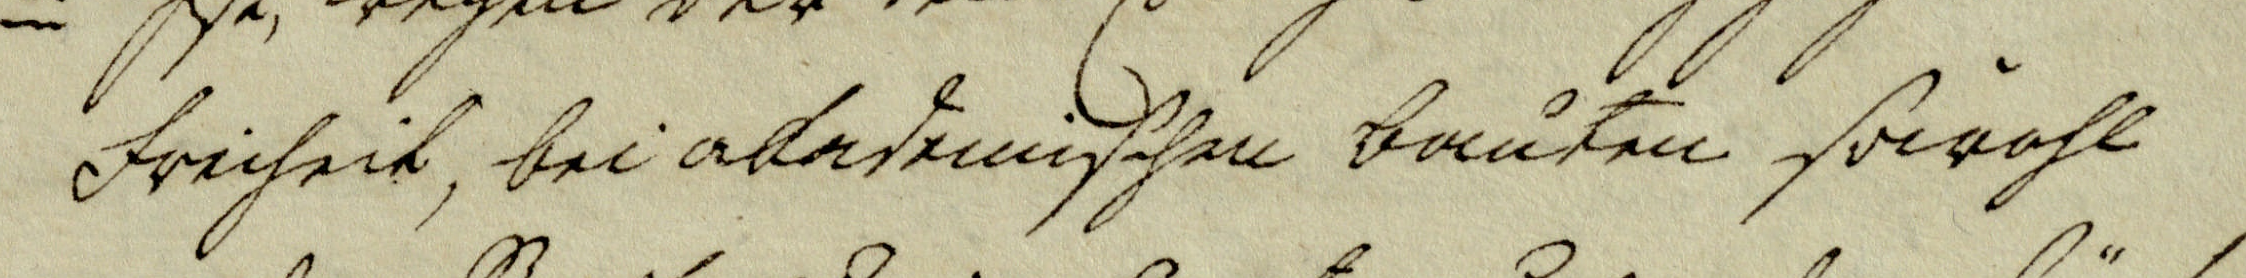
Freiheit, bei akademischen Bauten sowohl
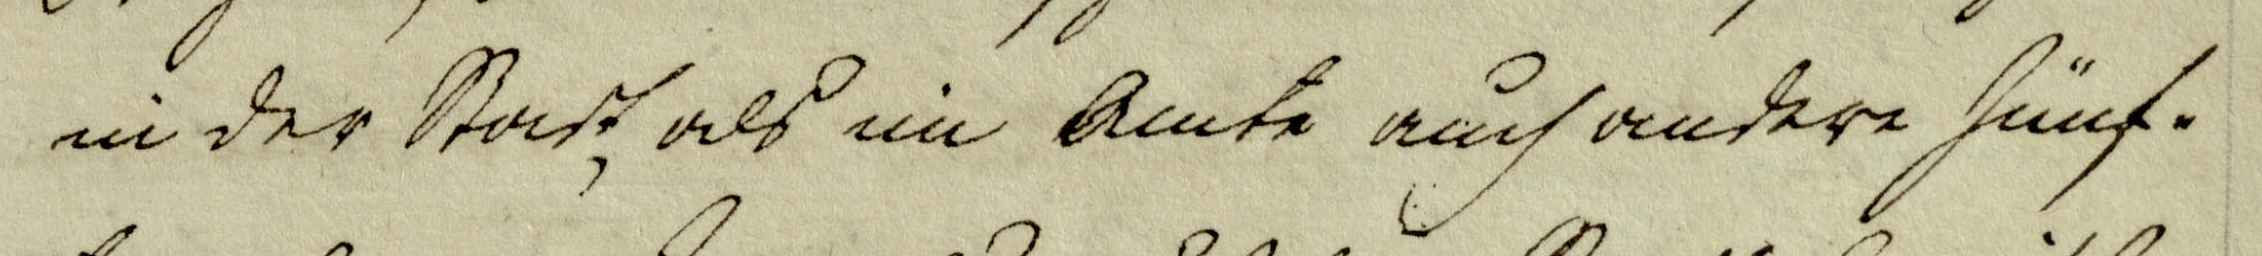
in der Stadt, als in Amte auch andere zünf¬
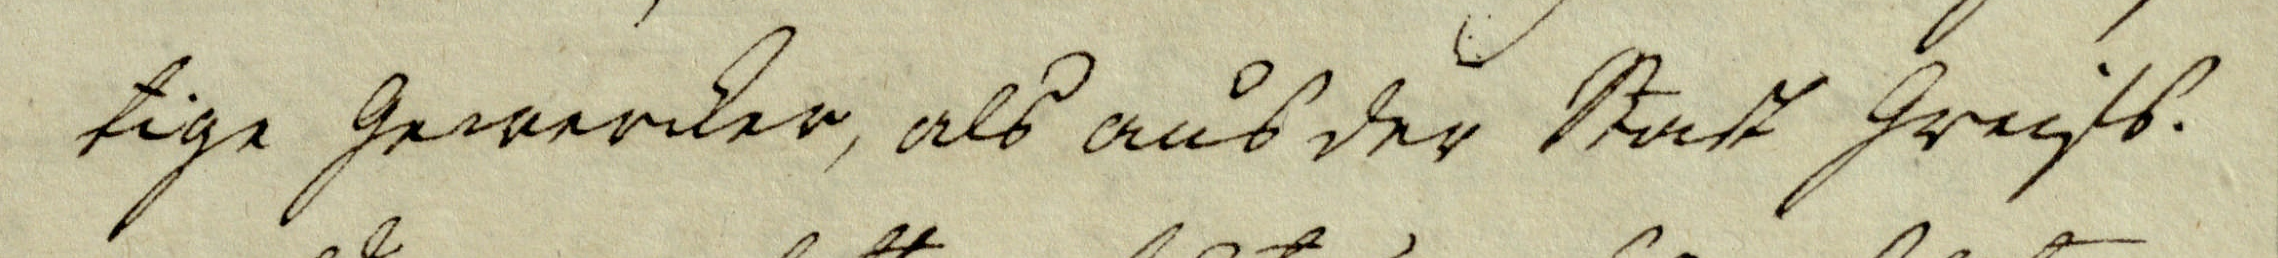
tige Gewercker, als aus der Stadt Greifs¬
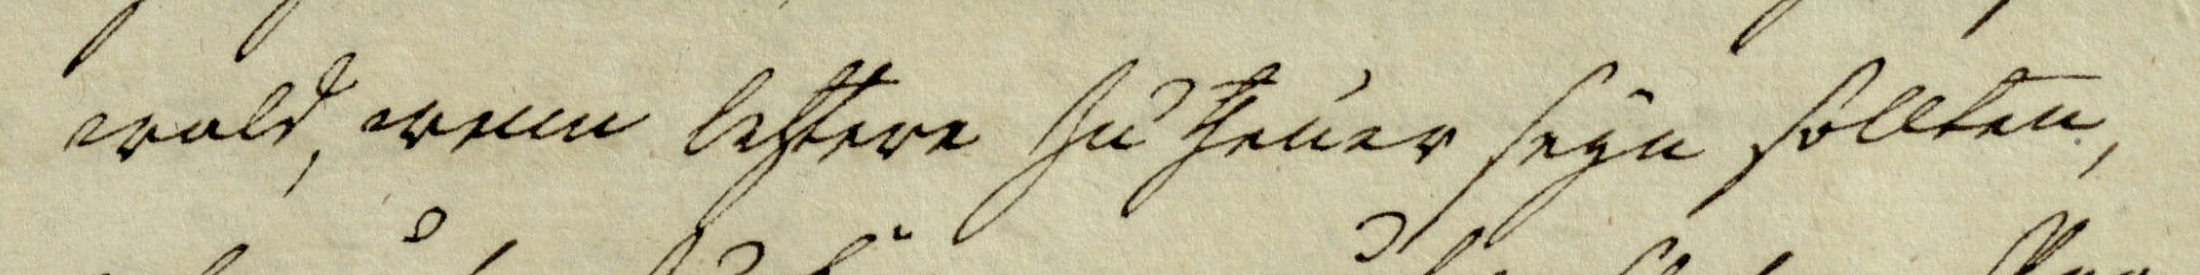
wald, wenn letztere zu theuer seÿn sollten,
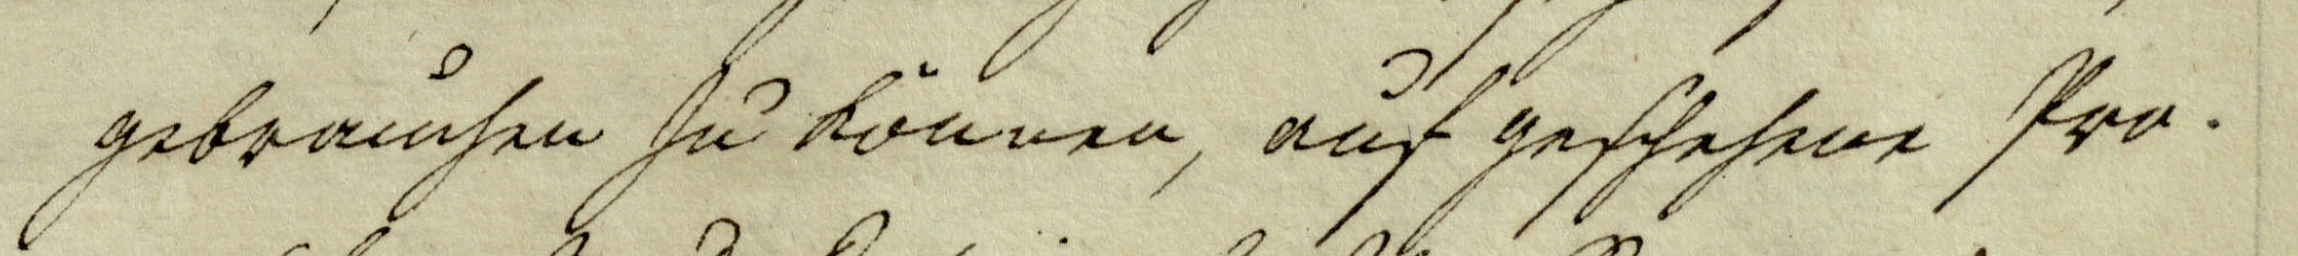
gebrauchen zu können, auf geschehene Pro¬
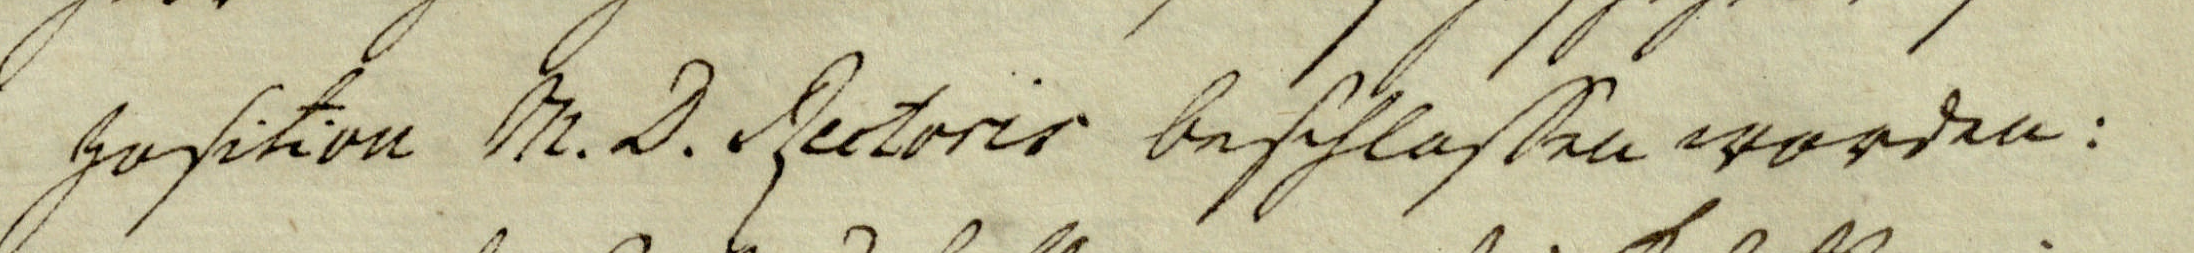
position M. D. Rectoris beschlossen worden:
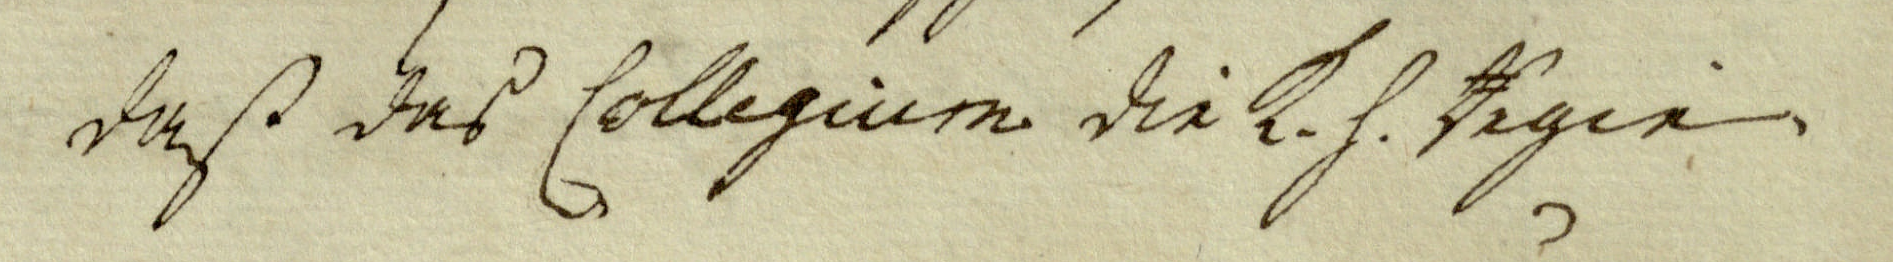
daß das Collegium die K.H. Regie¬
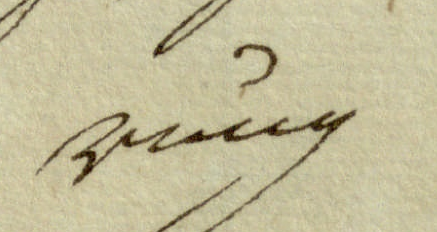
rung
